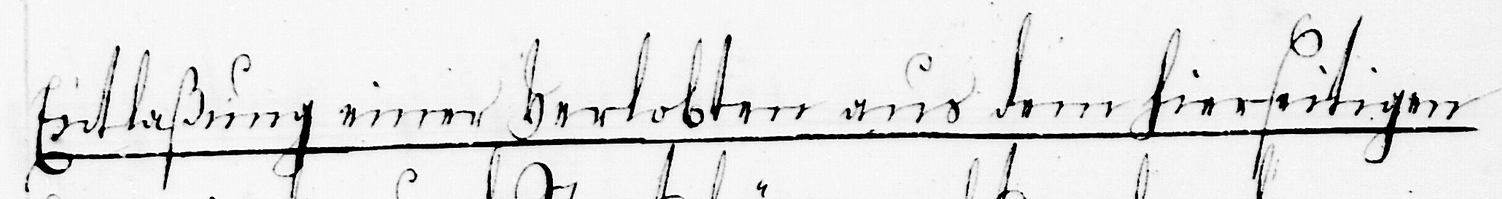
Entlaßung einer Verlobten aus dem hierseitigen
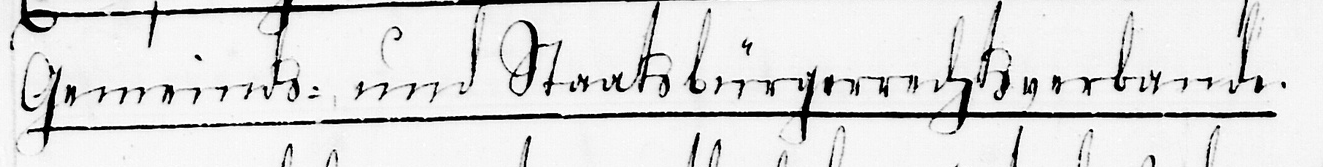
Gemeinds- und Staatsbürgerrechtsverbande.
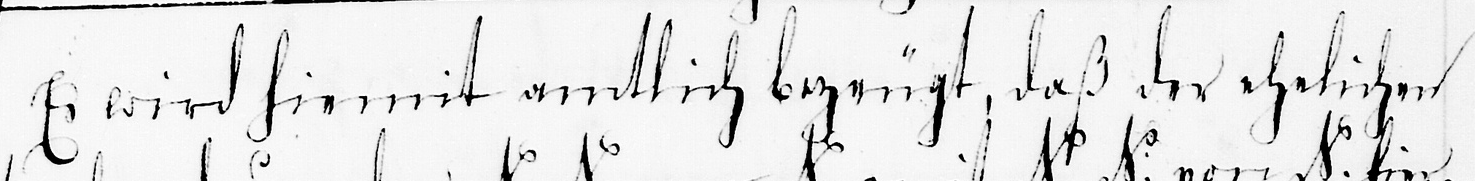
Es wird hiemit amtlich bezeugt, daß der ehelichen
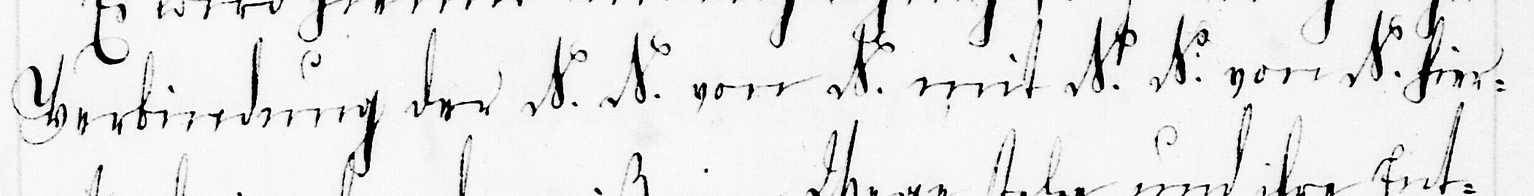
Verbindung der N. N. von N. mit N. N. von N. hier¬
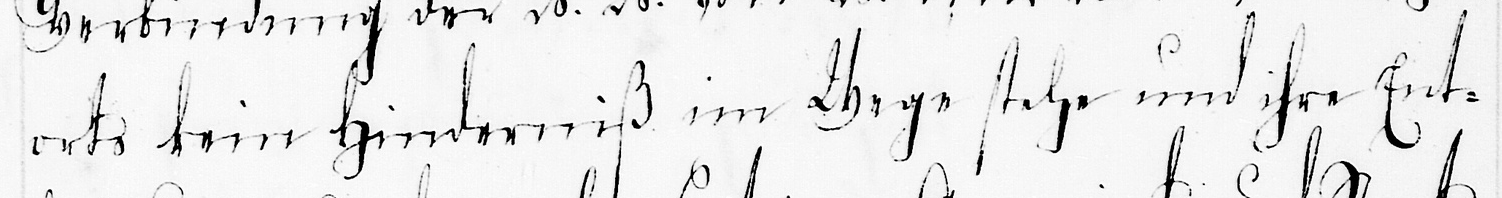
orts kein Hinderniß im Wege stehe und ihre Ent¬
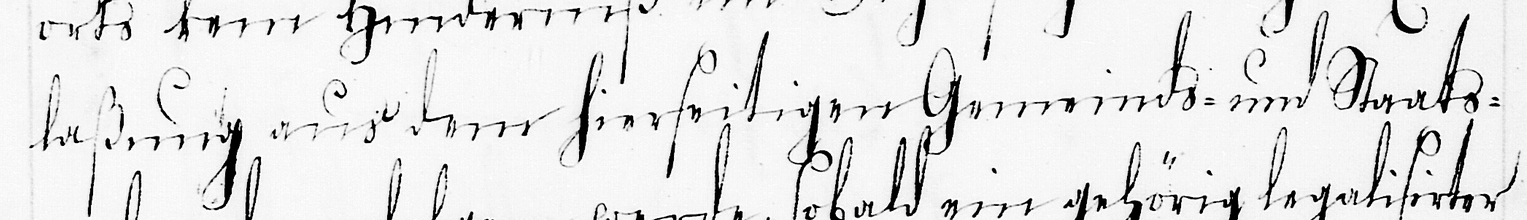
laßung aus dem hierseitigen Gemeinds- und Staats¬
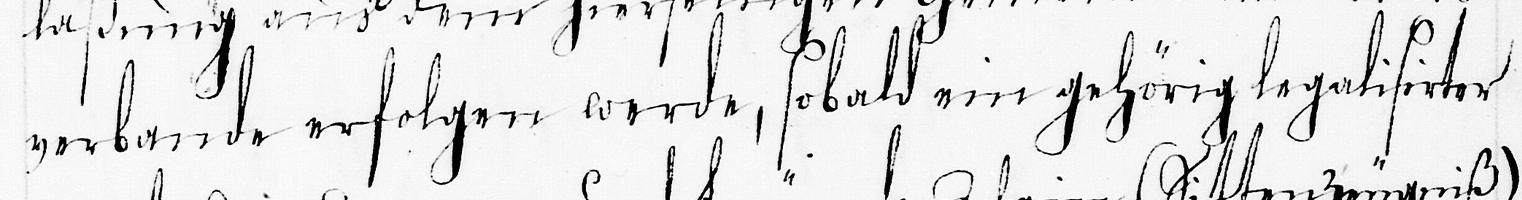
verbande erfolgen werde, sobald ein gehörig legalisirter
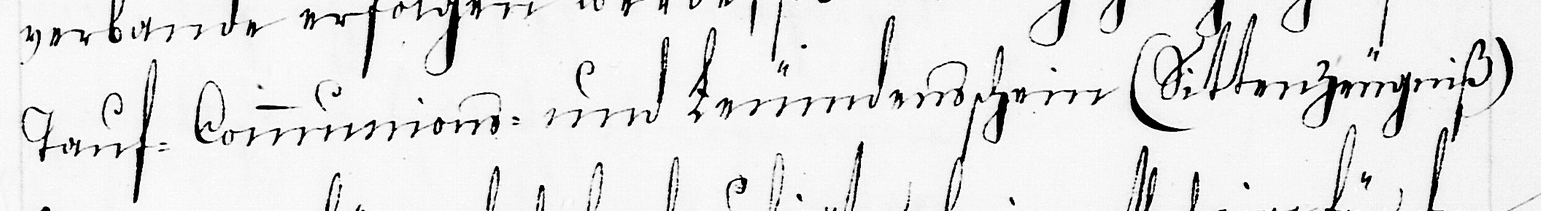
Tauf- Communions- und Leumdensschein (Sittenzeugniß)
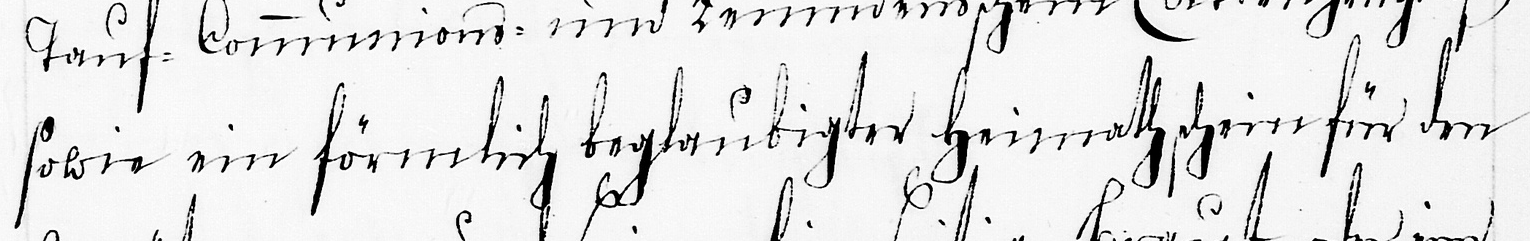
sowie ein förmlich beglaubigter Heimathschein für den
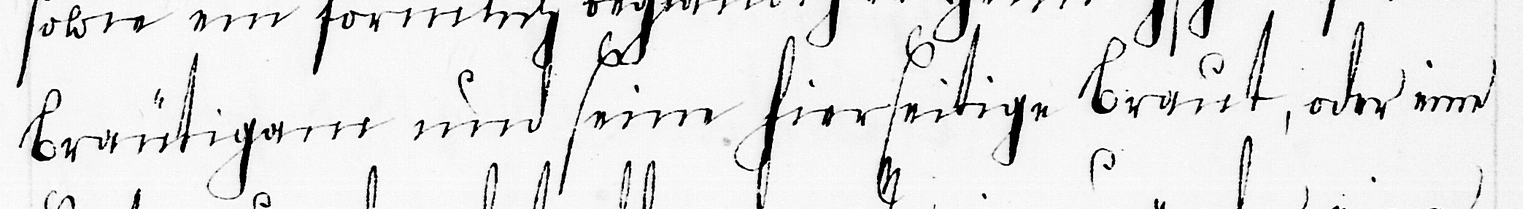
Bräutigam und seine hierseitige Braut, oder eine
